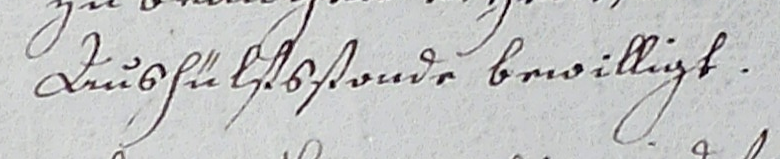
Aushülfsfonde bewilligt.
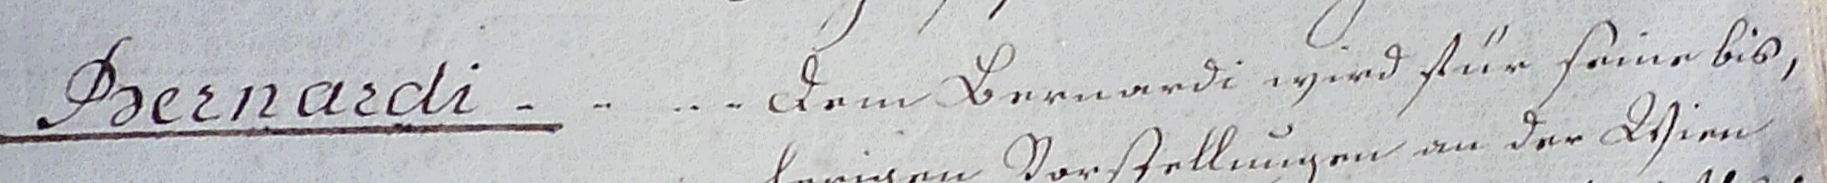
Bernardi .. .. .. .. Dem Bernardi wird für seine bis¬
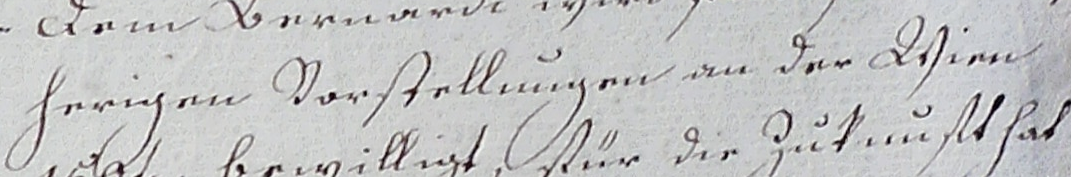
herigen Vorstellungen an der Wien
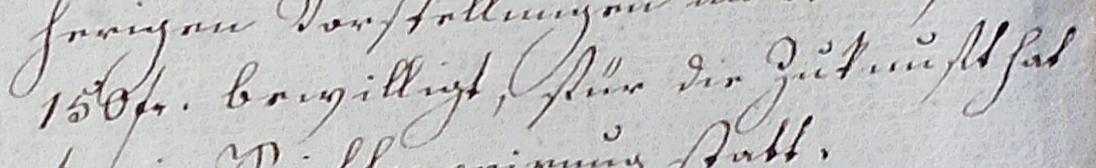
150fr. bewilligt, für die Zukunft hat
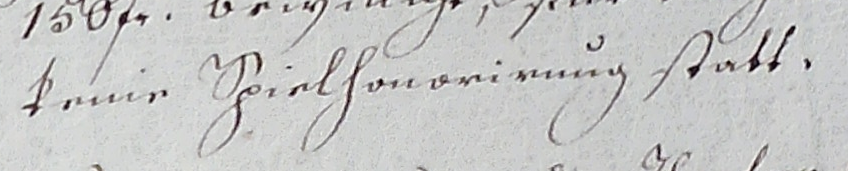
keine Spielhonorirung statt.
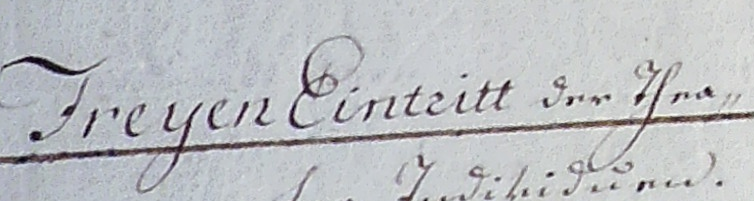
Freyen Eintritt der Thea¬
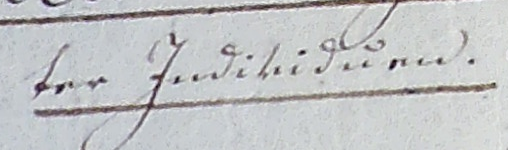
ter Individuen.
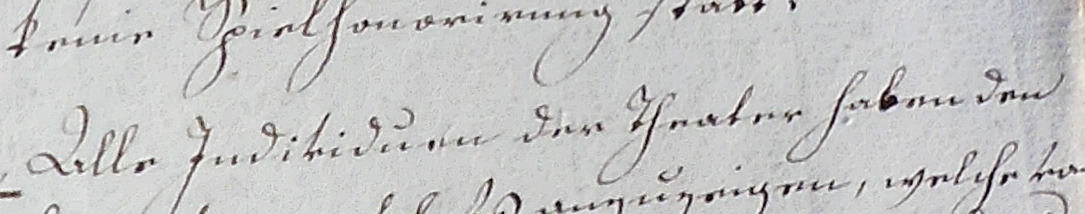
Alle Individuen der Theater haben den
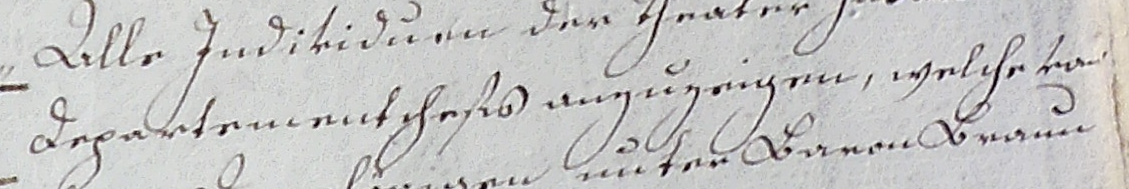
Departementchefs auzuzeigen, welche von
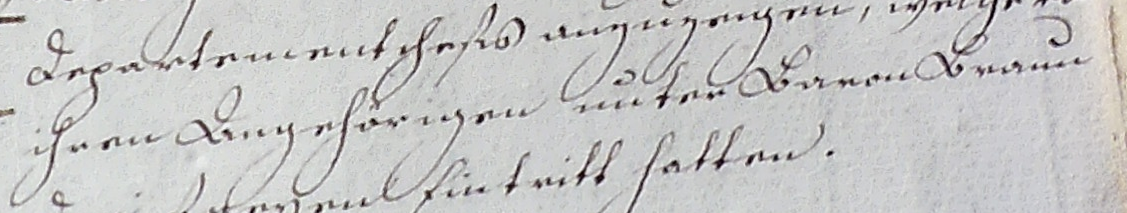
ihren Angehörigen unter Baron Braun
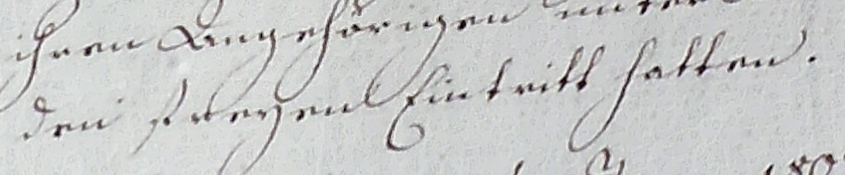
den freyen Eintritt hatten.
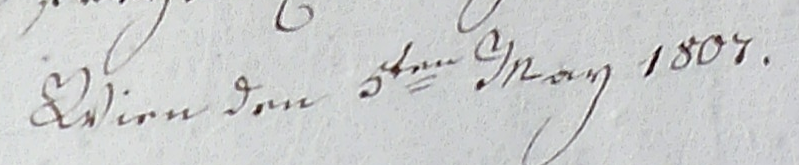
Wien den 5te͇n May 1807.
